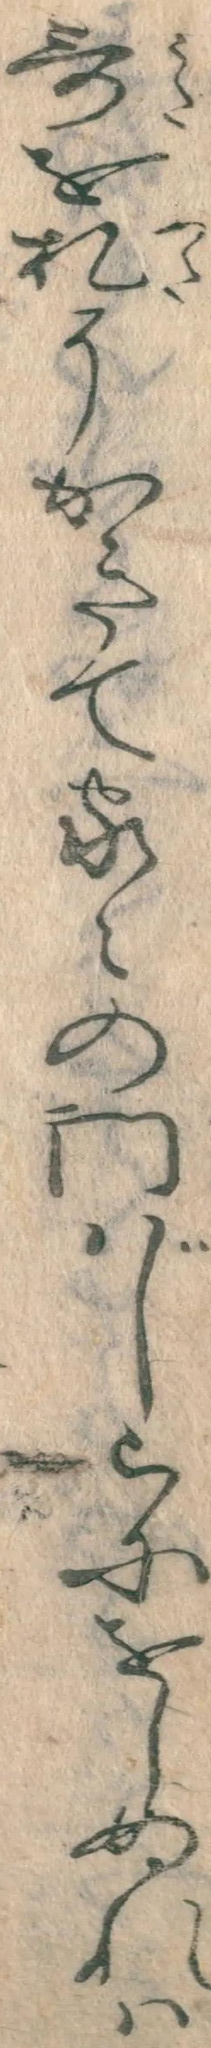哥を札にかきて家々の門ばしらにをしぬれば
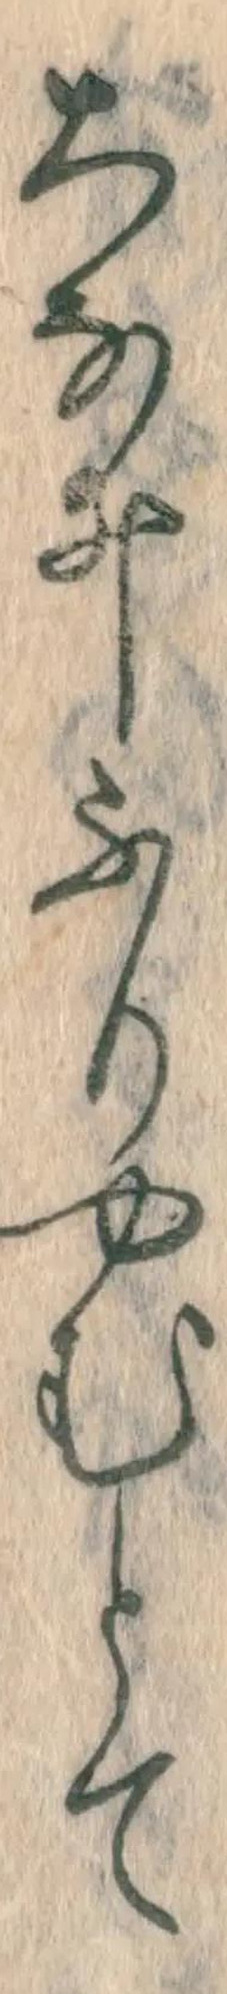大なゐふりやむとて
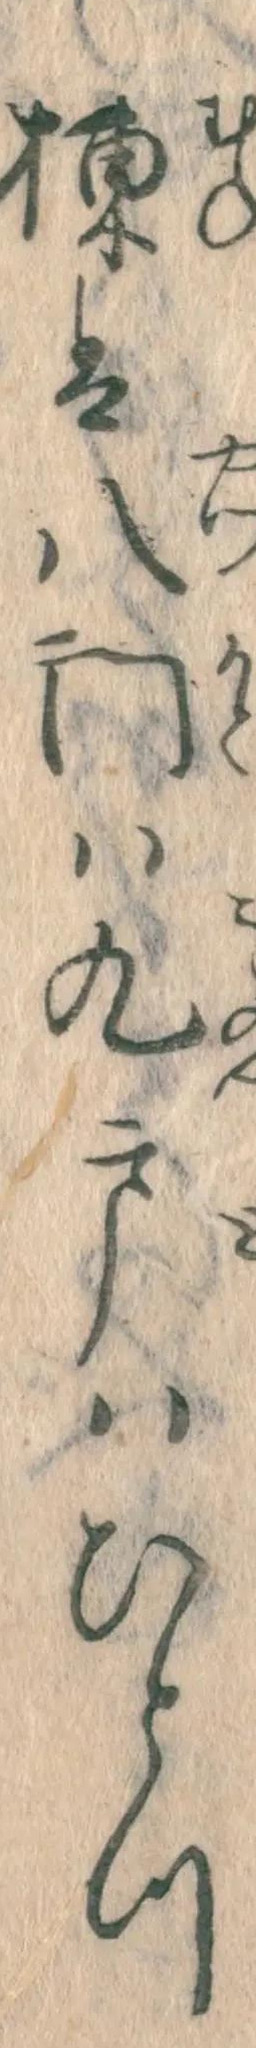棟は八門は九戸はひとつ
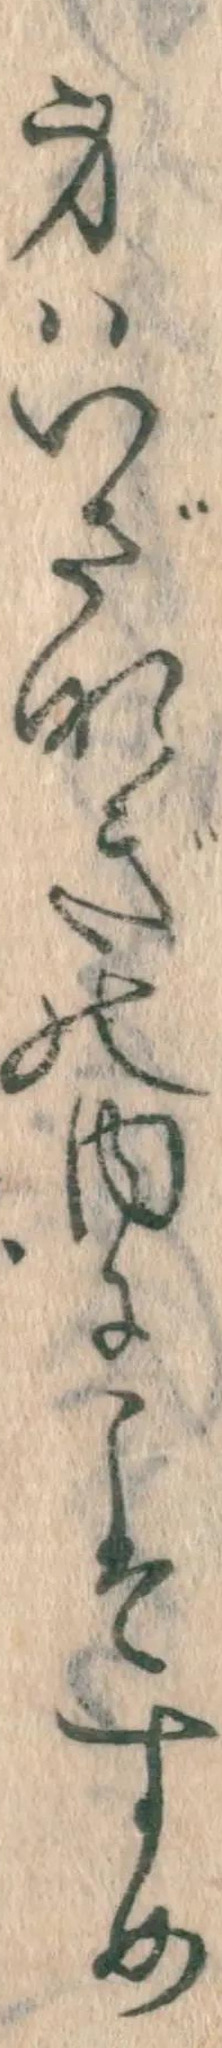身はいざなぎの内にこそすめ
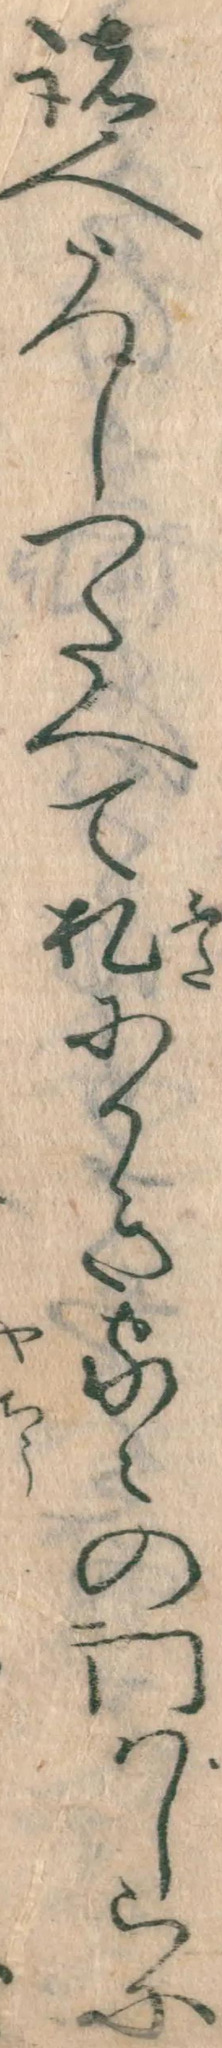諸人うつしつたへて札にかき家々の門ばしらに
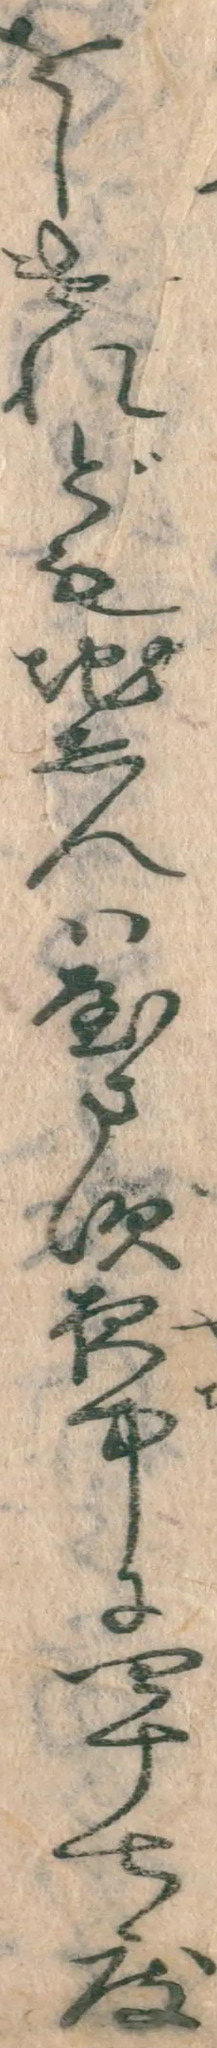をしけれども地しんはやます夜中に四十七度
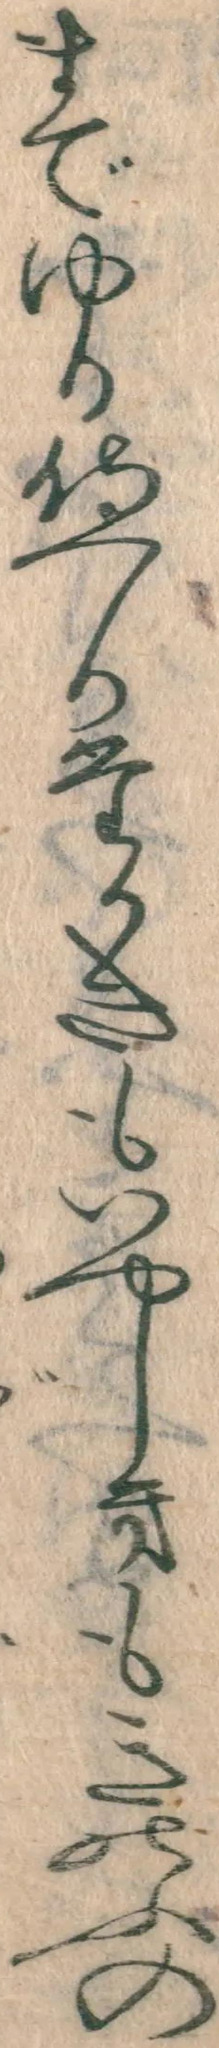までゆり侍へりたかきもいやしきもきのふの
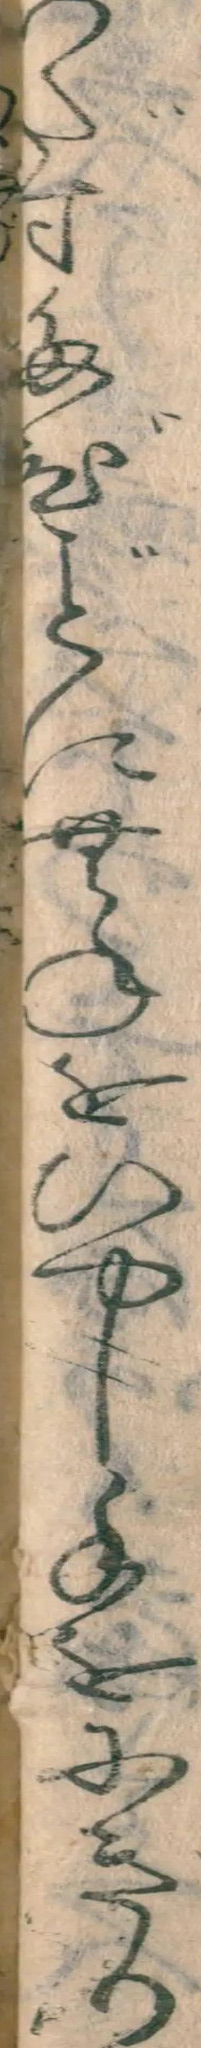いだすたびごとにむねをひやし手をにきり
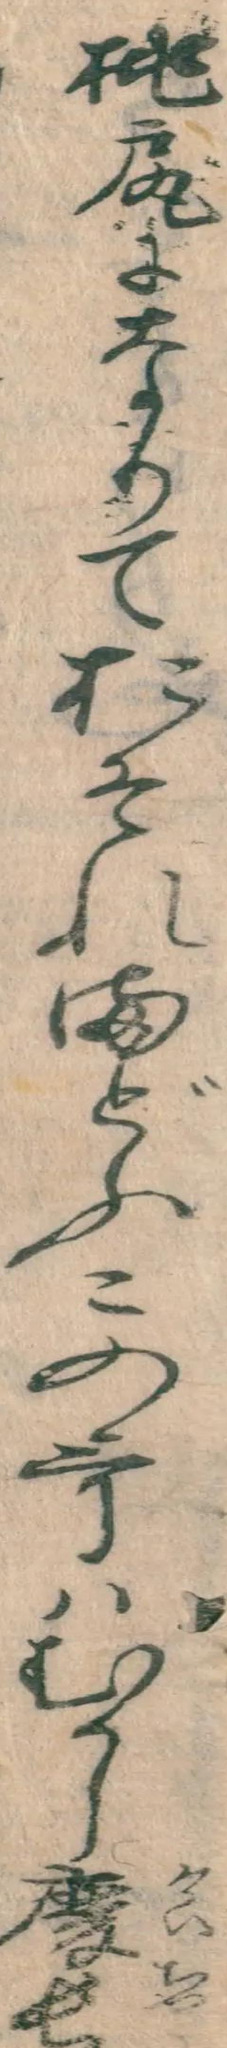桃尻になりておそれまどふこの哥はむかし慶長
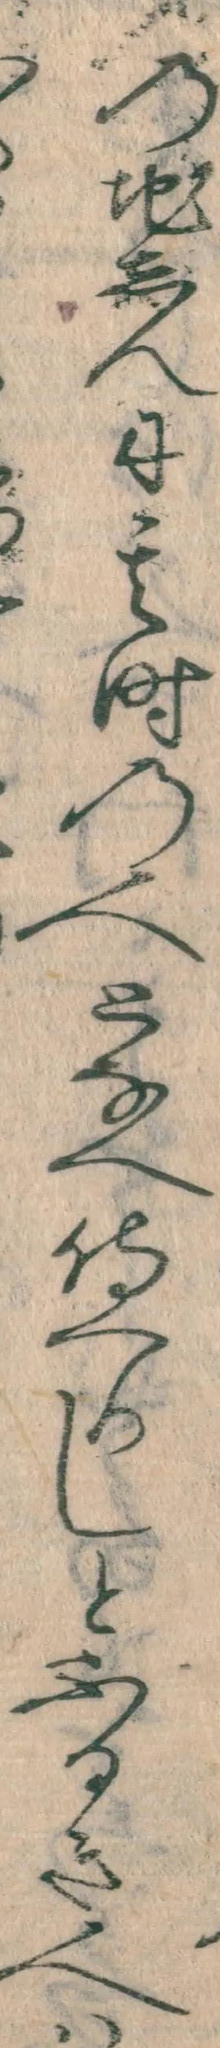の地しんに其時の人となへ侍へりしとふるき人は
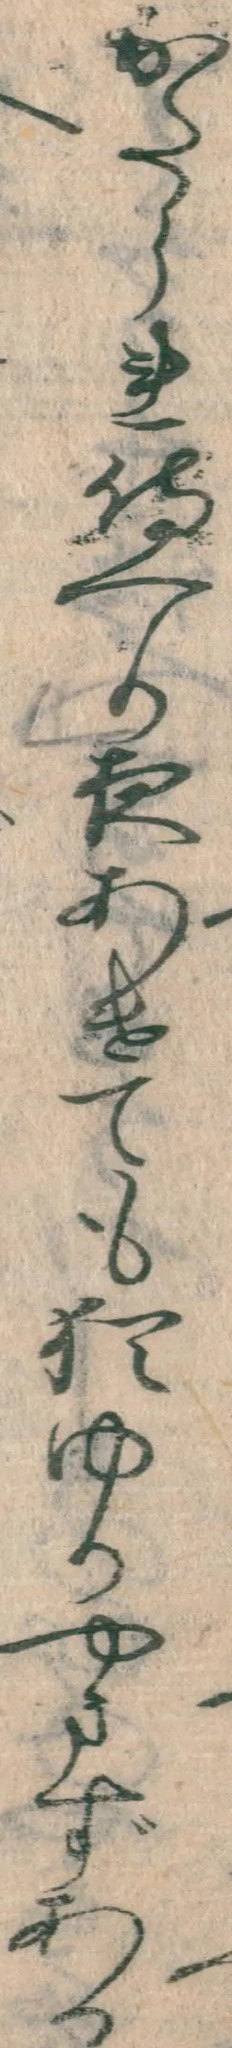かたられ侍へり夜あけても猶ゆりやまずある
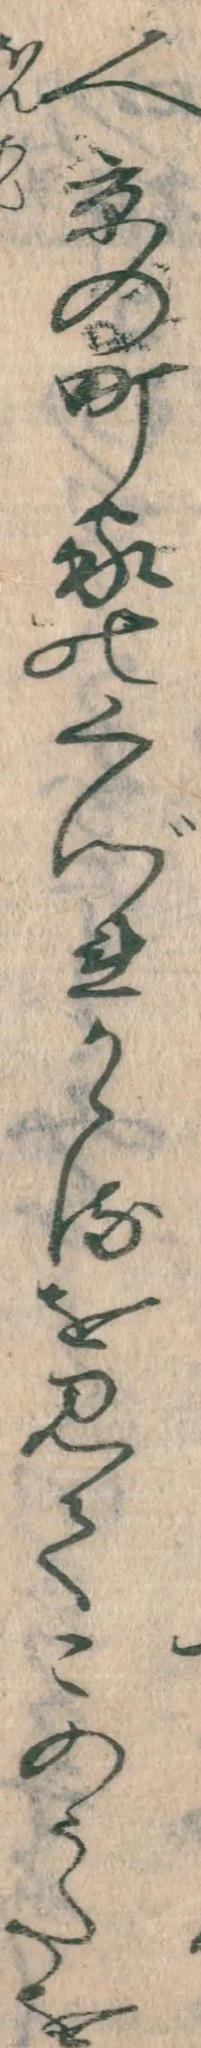人京の町家のくづれかゝるを見てこのうたを
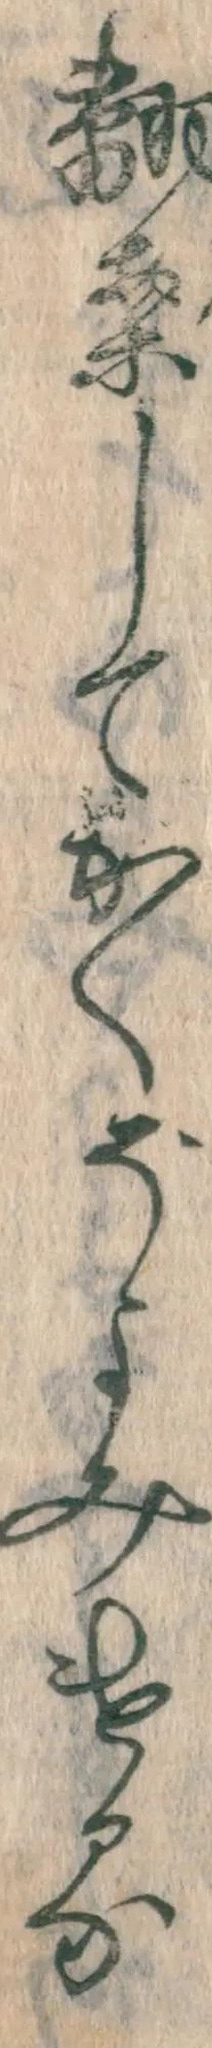翻案してかくぞよみける
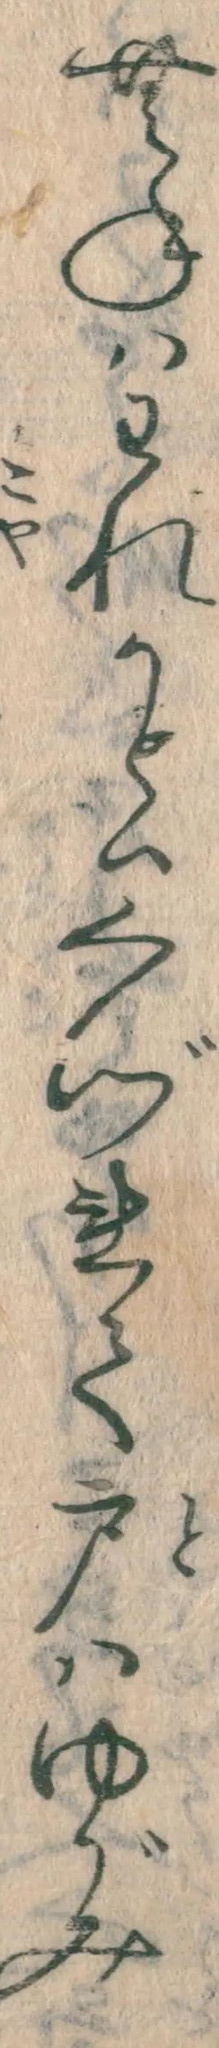むねはわれかとはくづれて戸はゆがみ
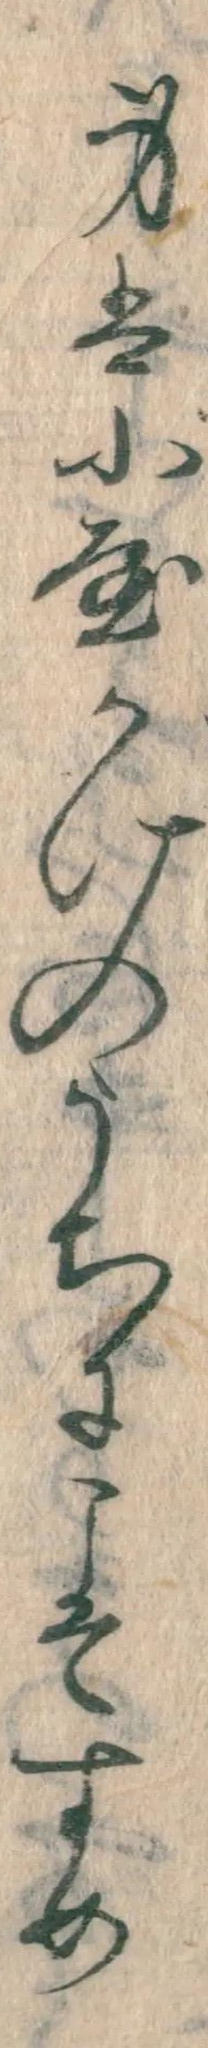身は小屋がけのうちにこそすめ
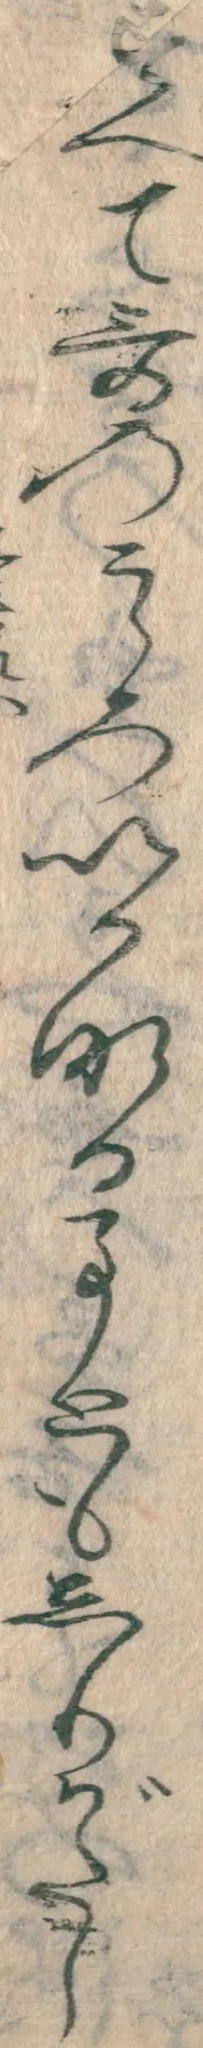すべて哥のこゝろいかなる事ともしりがたし
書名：艱難目異志. 上,下
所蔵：国立国会図書館 National Diet Library, JAPAN
